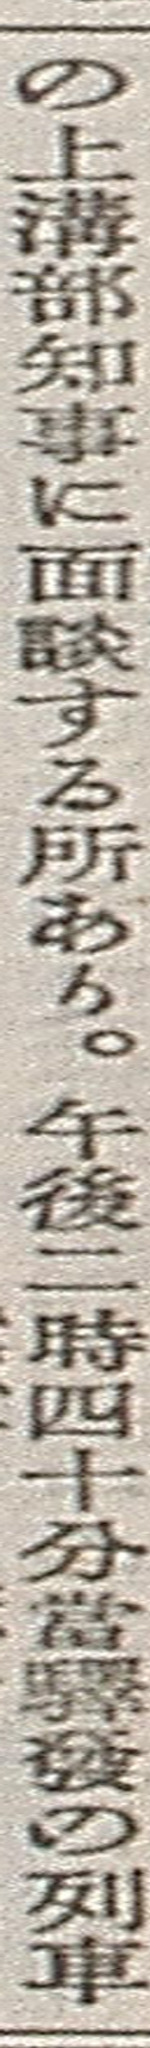の上溝部知事に面談する所あり。午後二時四十分当駅発の列車
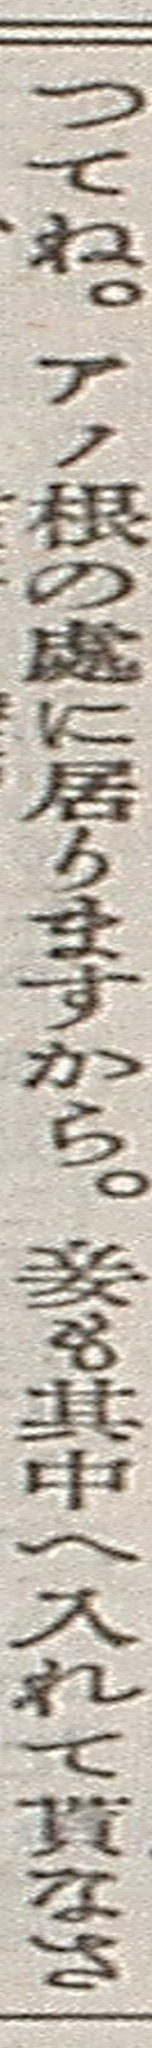つてね。アノ根の処に居りますから。妾も其中へ入れて貰なさ
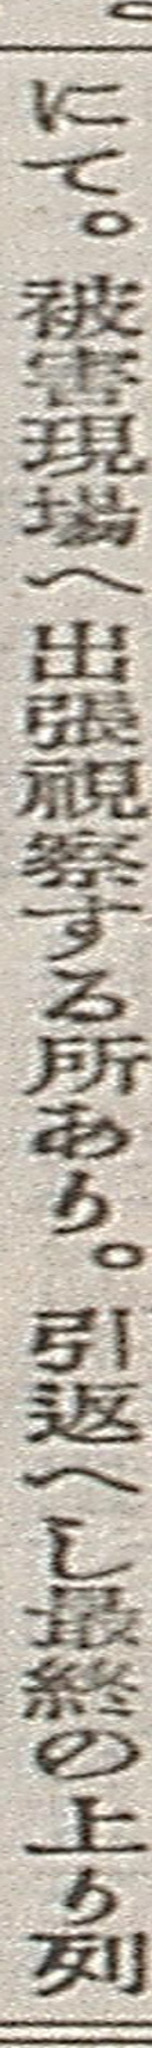にて。被害現場へ出張視察する所あり。引返へし最終の上り列
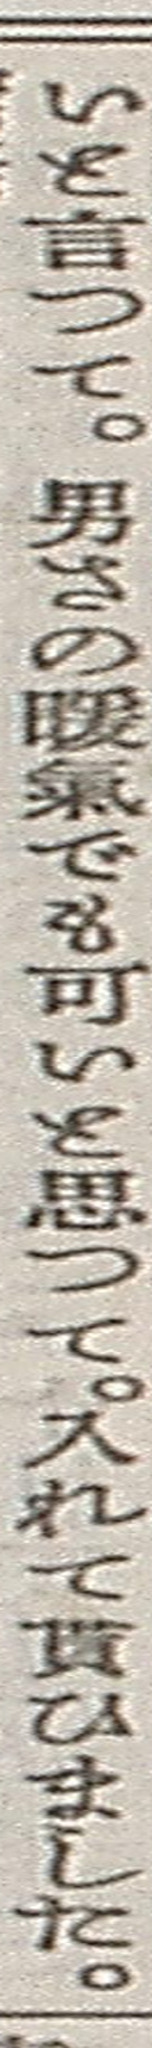いと言つて。男さの暖気でも可いと思つて。入れて貰ひました。
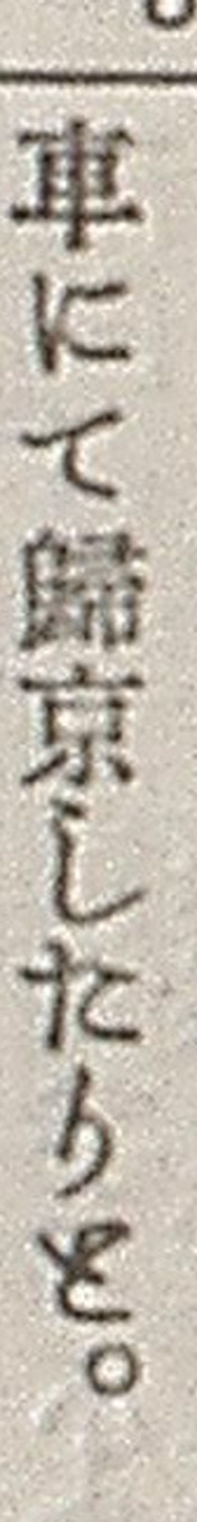車にて帰京したりと。
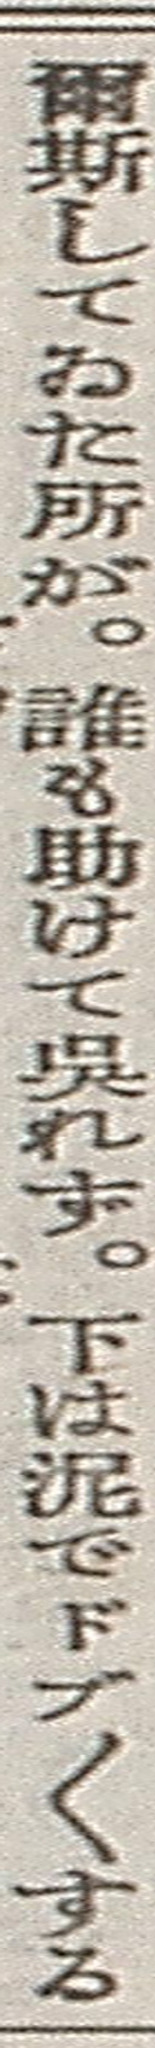爾斯してゐた所が。誰も助けて呉れず。下は泥でドブ〳〵する
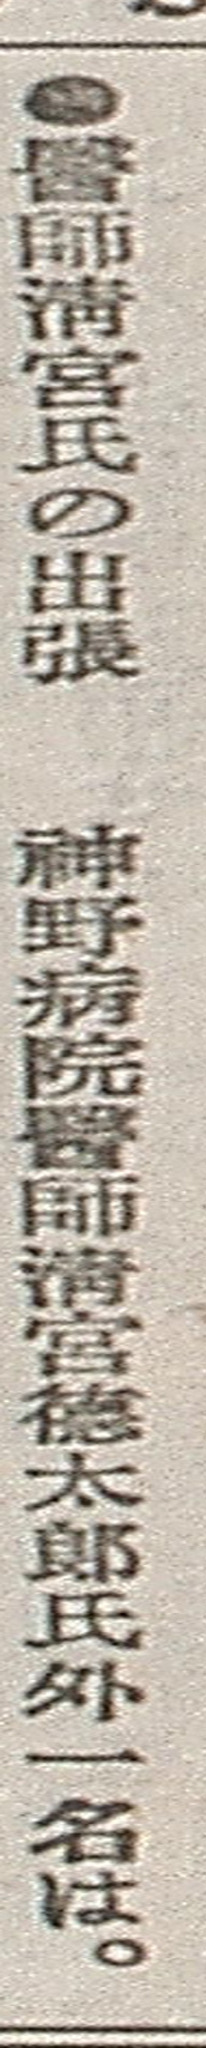●医師清宮氏の出張神野病院医師清宮徳太郎氏外一名は。
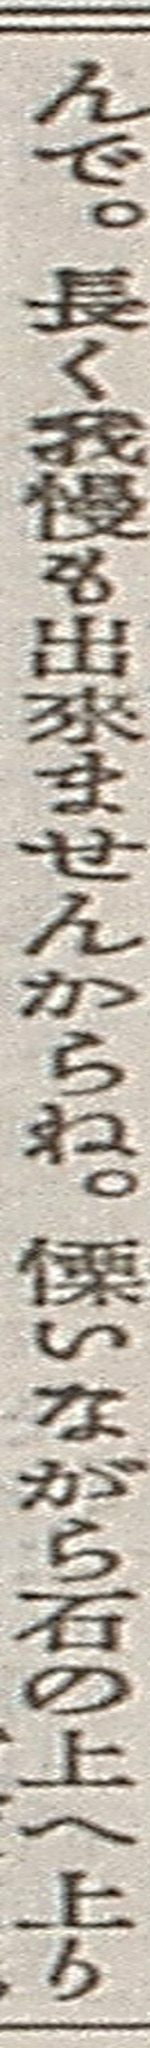んで。長く我慢も出来ませんからね。慄いながら石の上へ上り
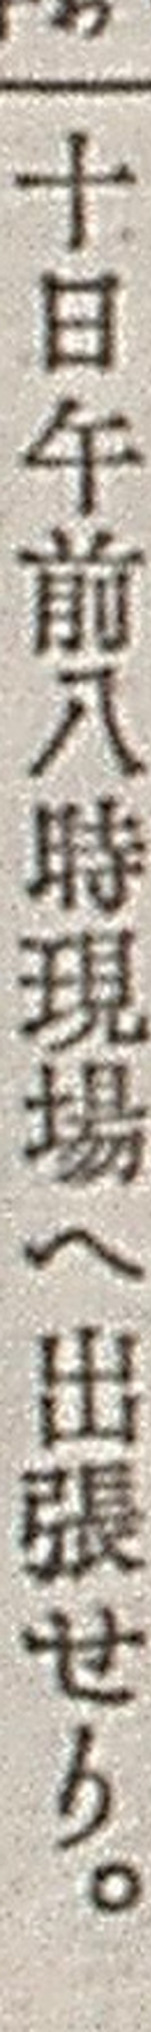十日午前八時現場へ出張せり。
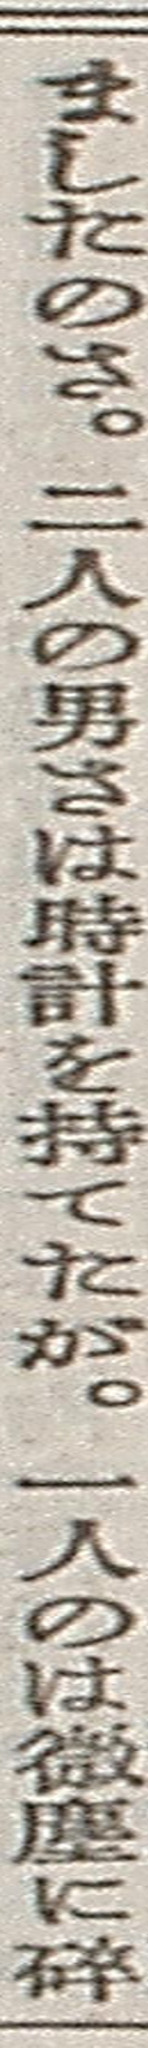ましたのさ。二人の男さは時計を持てたが。一人のは微塵に砕
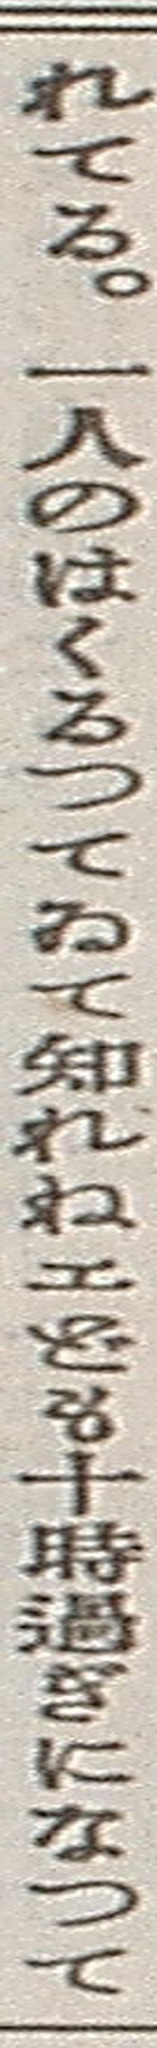れてる。一人のはくるつてゐて知れねエども十時過ぎになつて
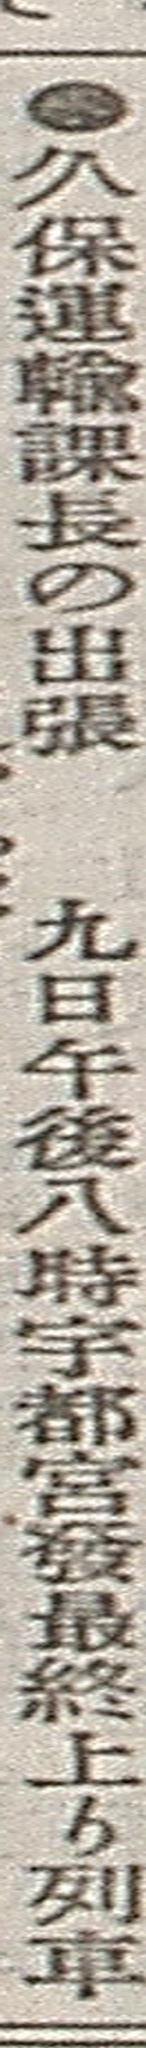●久保運輸課長の出張九日午後八時宇都宮発最終上り列車
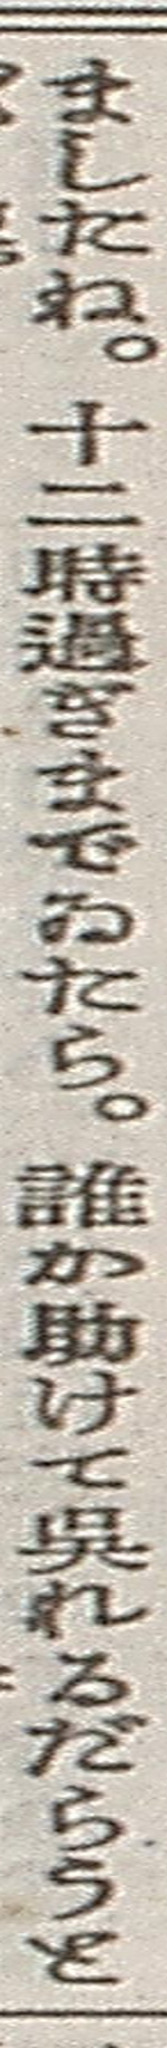ましたね。十二時過ぎまでゐたら。誰か助けて呉れるだらうと
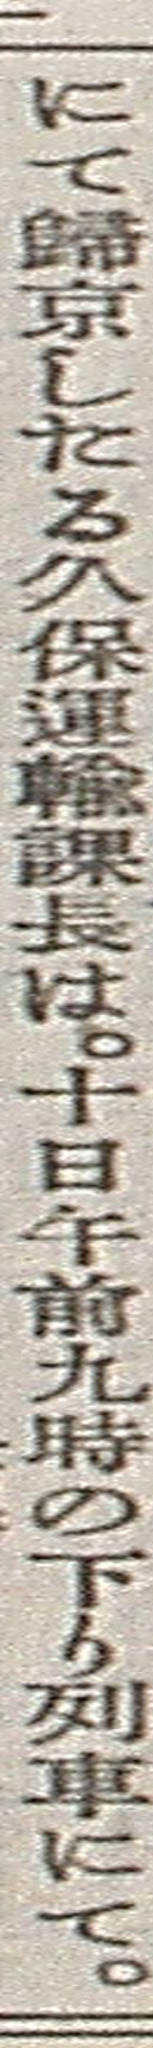にて帰京したる久保運輸課長は。十日午前九時の下り列車にて。
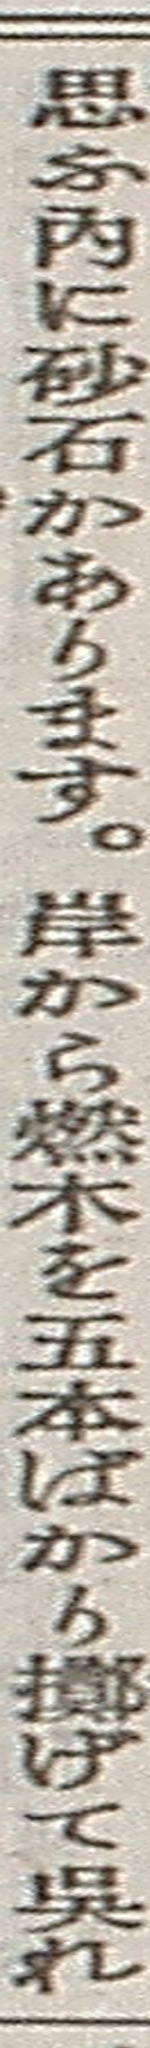思ふ内に砂石かあります。岸から燃木を五本ばかり擲げて呉れ
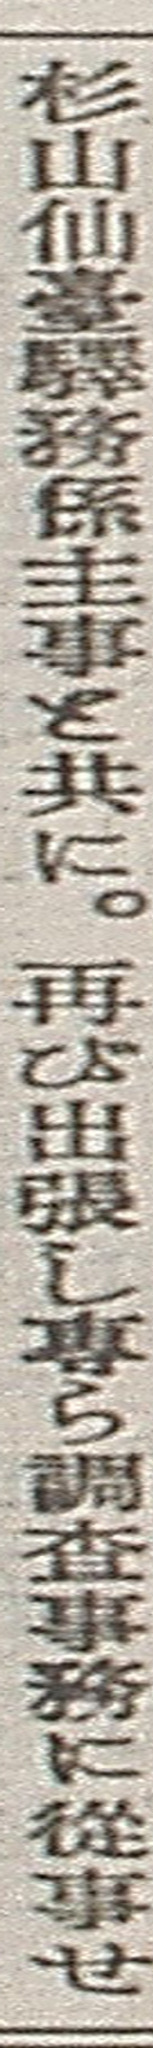杉山仙台駅務係主事と共に。再び出張し専ら調査事務に従事せ
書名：風俗畫報臨時増刊第百九十九號　明治三十二年十月各地災害圖會（前編之續）
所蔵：東京大学地震研究所図書室 Earthquake Research Institute Library, The University of Tokyo, JAPAN
